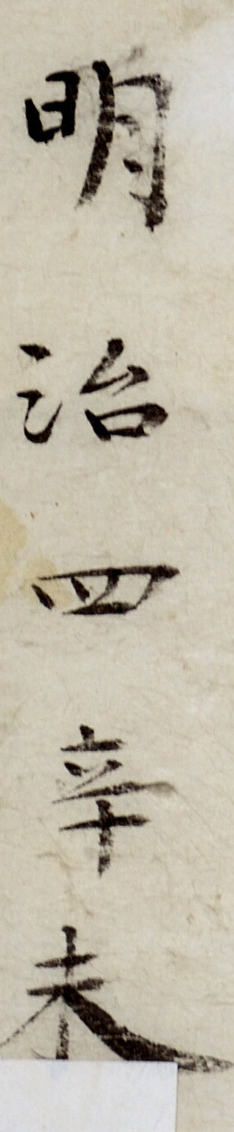明治四辛未
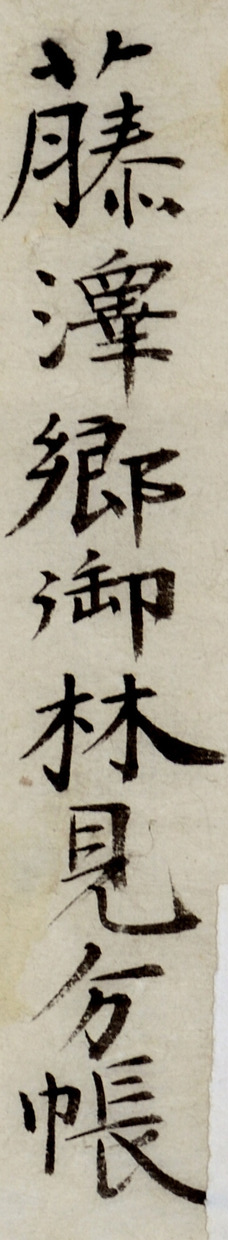藤沢郷御林見分帳
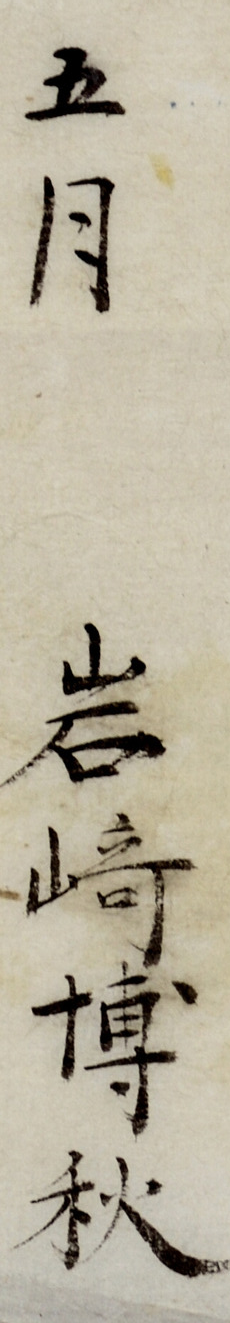五月岩崎博秋
